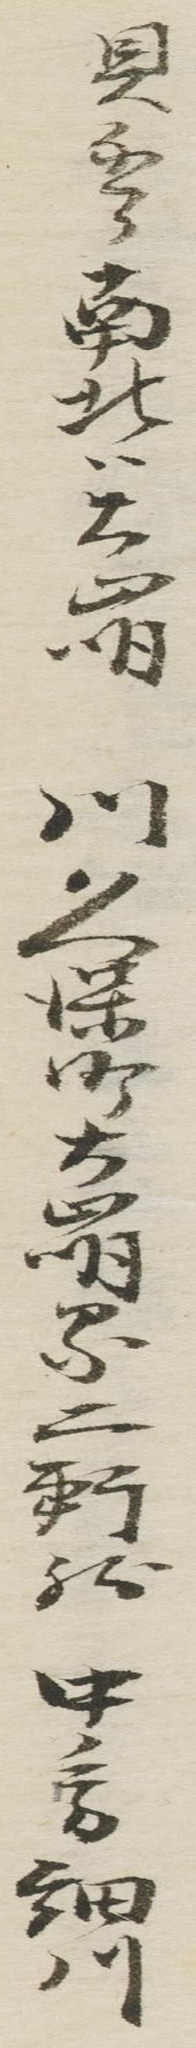貝通り南北ハ大崩川久保町大崩家二軒然中ノ方細川

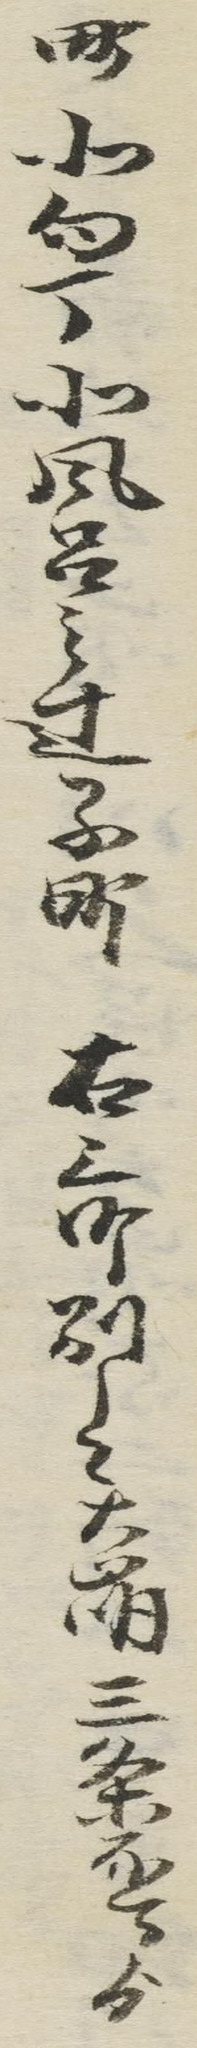町北句丁北風呂之辻子町右三町別して大崩三条通りゟ
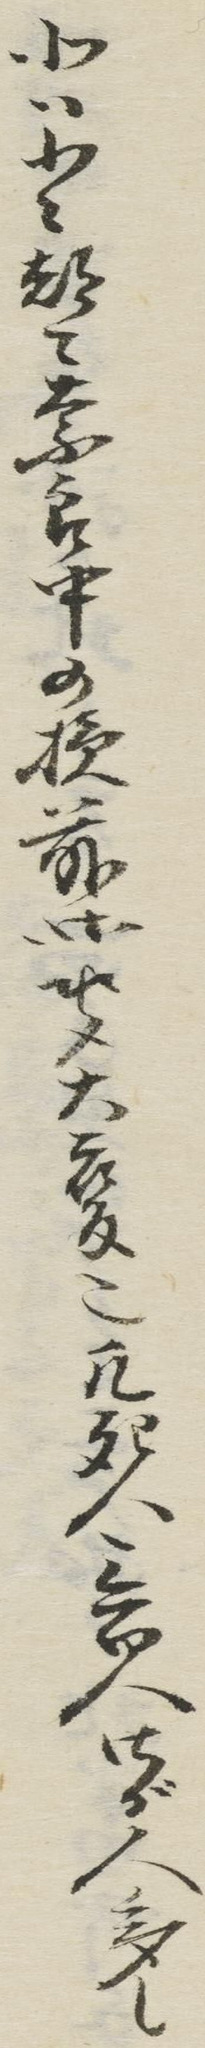北ハ少々都て奈良中の損前御聞大変也凡死人三百人けが人多し
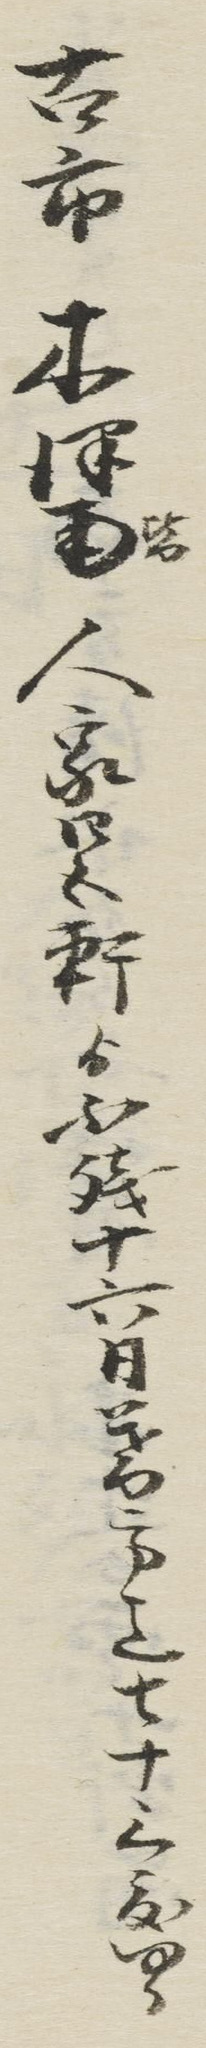古市木澤南人家四五軒ゟ不残十六日暮方迄七十三度ゆり
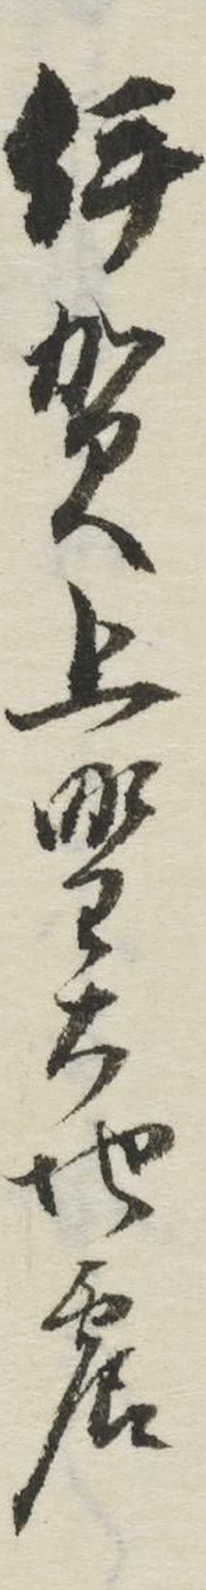伊賀上野大地震
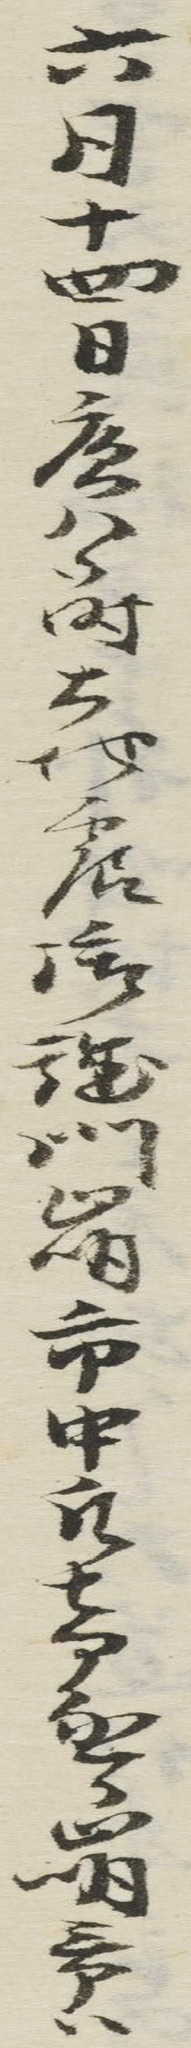六月十四日夜八ツ時大地震御徳門崩市中凡七部通り崩れ三戸ハ
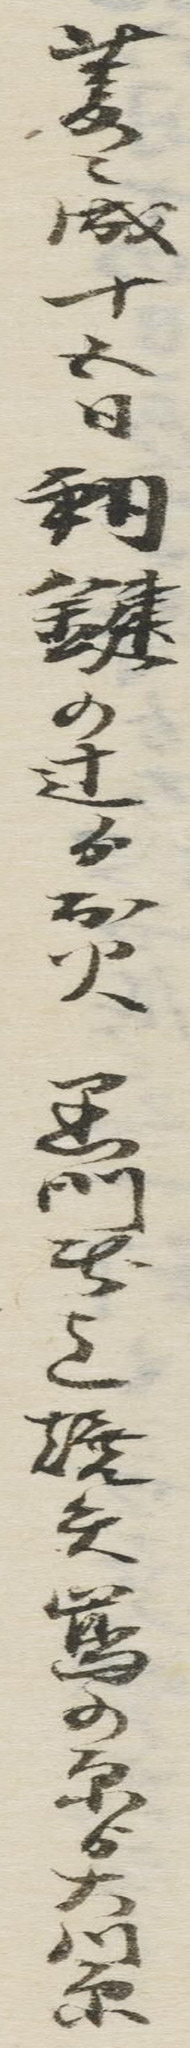菱二成十五日朝鍵の辻ゟ出火黒門前迄焼失嶌の原ゟ大川原
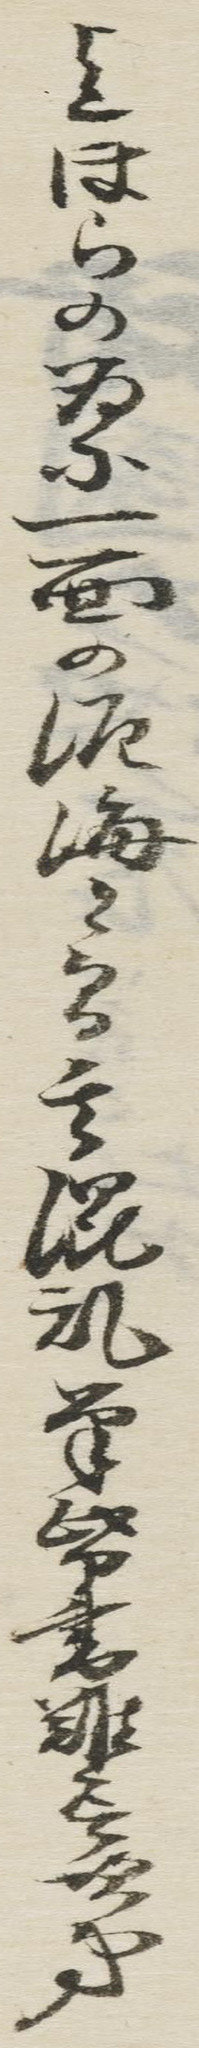迄ほらの為に一面の泥海となる其混乱筆紙書難尽次第
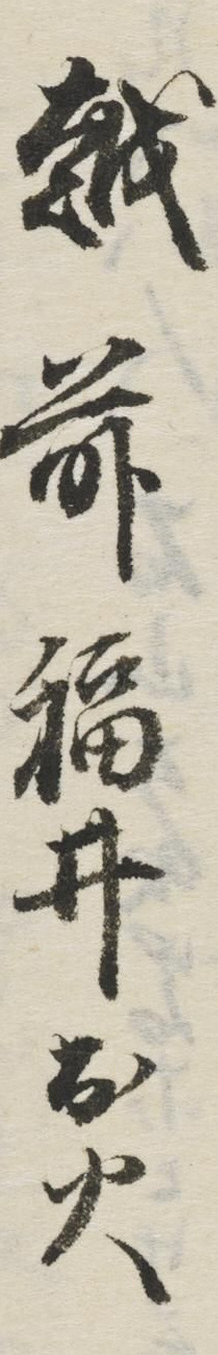越前福井出火
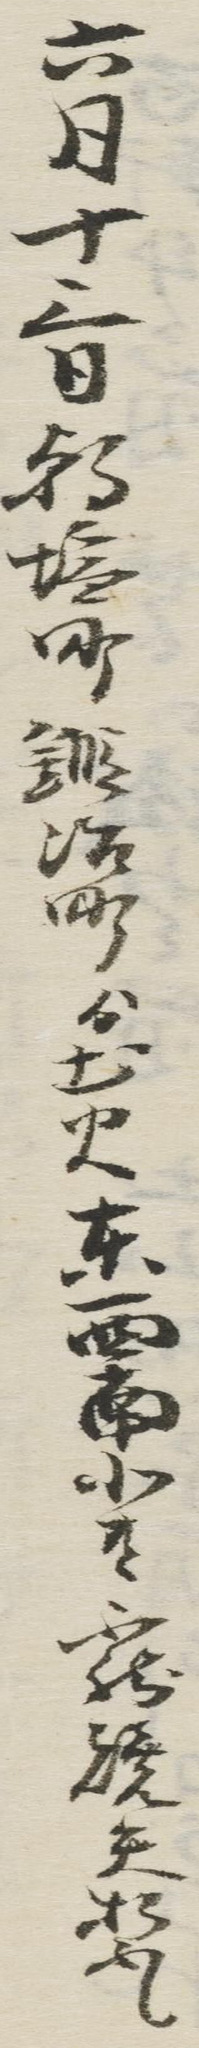六月十三日朝塩町鍛冶町ゟ出火東西南北共不残焼失数なし
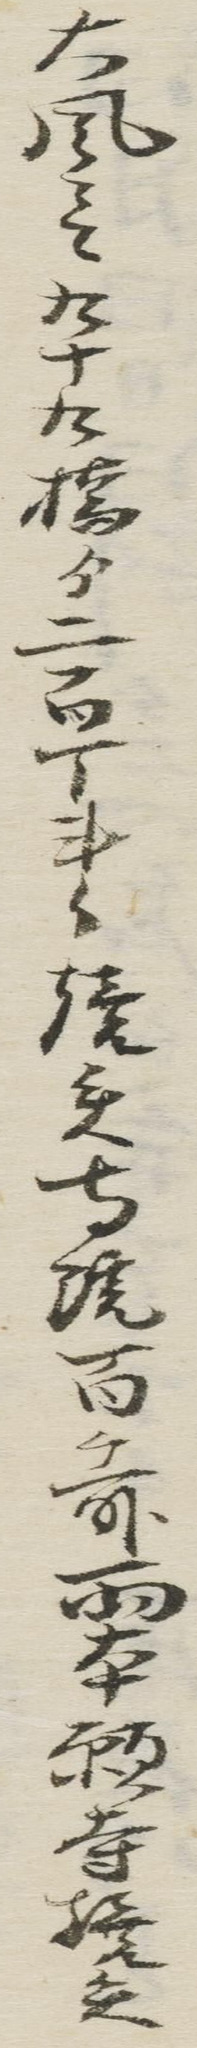大風ニテ九十九橋ゟ二百丁斗り焼失寺院百ヶ所両本願寺焼失
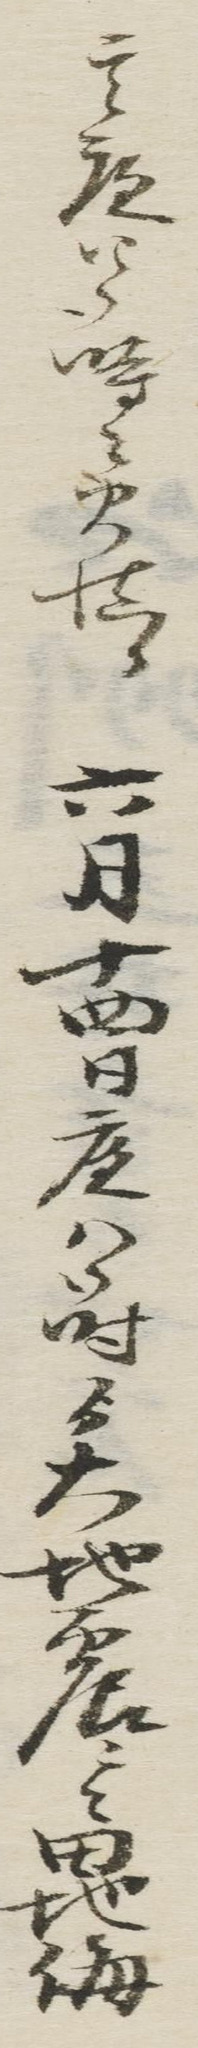其夜四ツ時ニ火慎り六月十四日夜八ツ時ゟ大地震ニて田地海
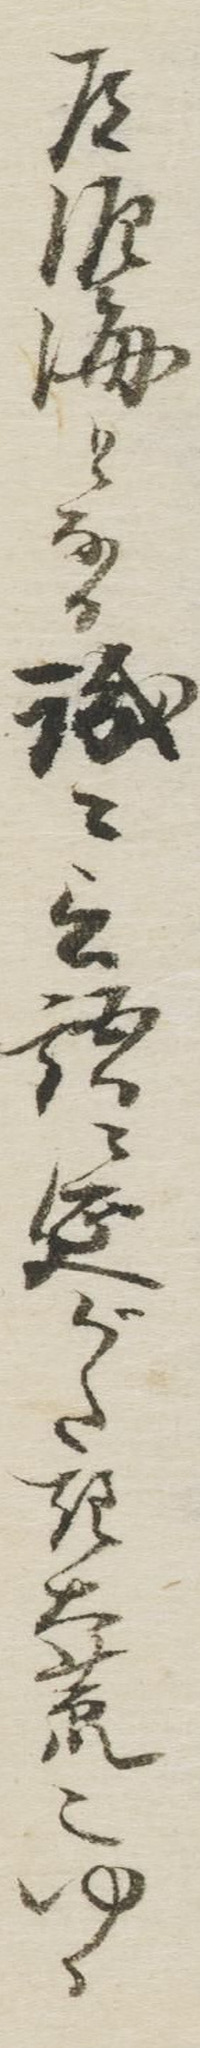道泥海となる誠二言語ニ延がたき大荒也ゆり
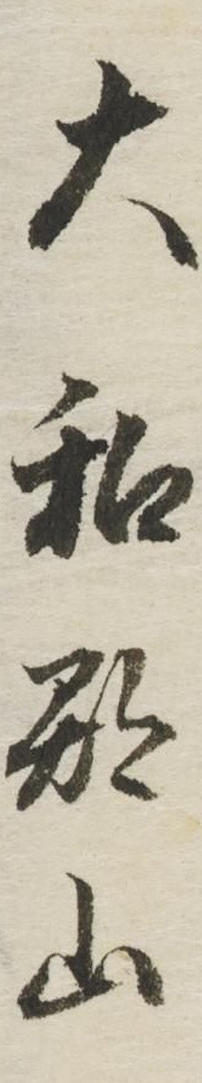大和郡山

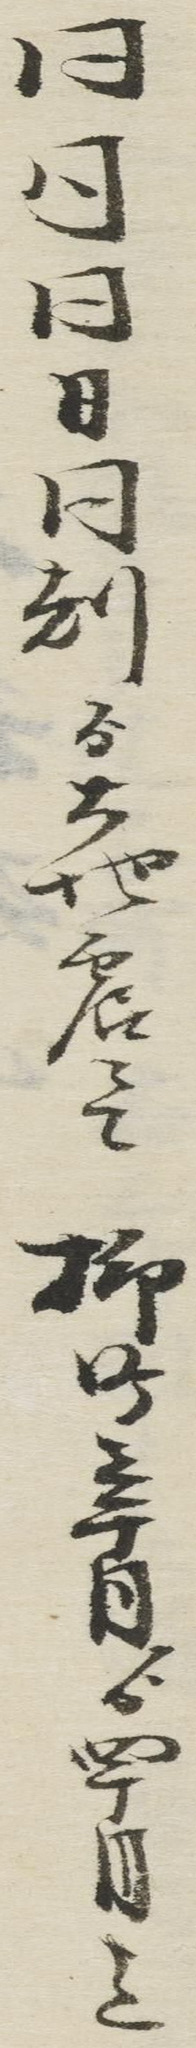同月同日同刻ゟ大地震ニて柳町壱丁目ゟ四丁目迄
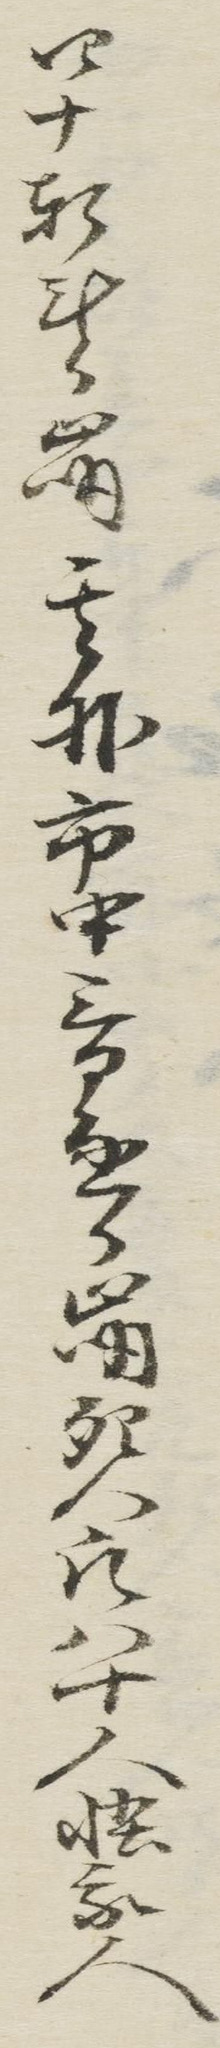四十軒斗り崩其外市中三部通り崩死人凡八十人怪我人
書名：諸国大地震大津波一代記
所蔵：東京大学地震研究所図書室 Earthquake Research Institute Library, The University of Tokyo, JAPAN
